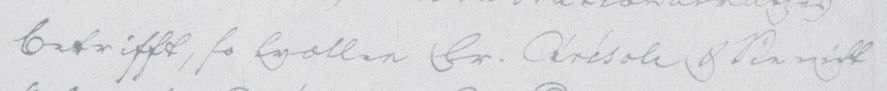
betrifft, so wollen Hr. Cérésole & Sie nicht
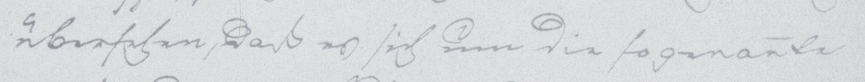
übersehen, daß es sich um die sogenannte
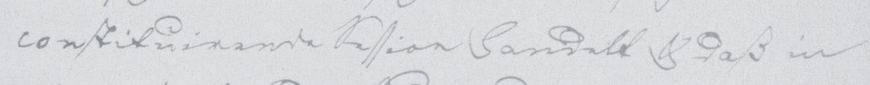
constituirende Session handelt & daß in
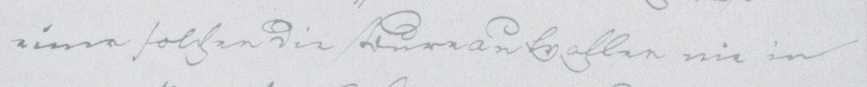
einer solchen die Bureauwahlen nie in
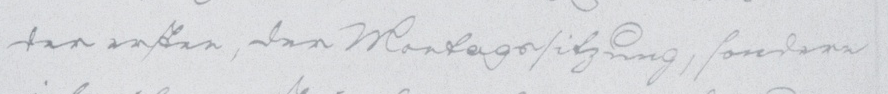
der ersten, der Montagssitzung, sondern
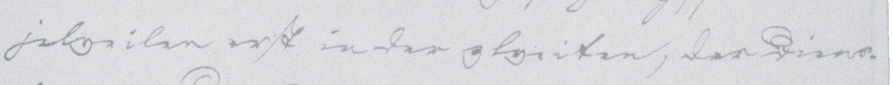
jeweilen erst in der zweiten, der Diens-
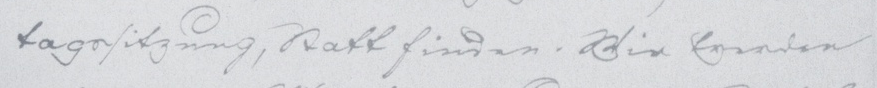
tagssitzung, Statt finden. Wir werden
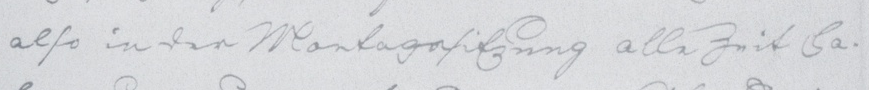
also in der Montagssitzung alle Zeit ha-
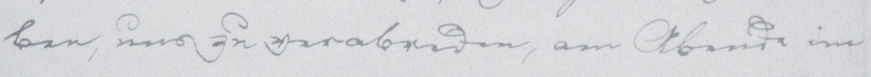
ben, uns zu verabreden, am Abends im
